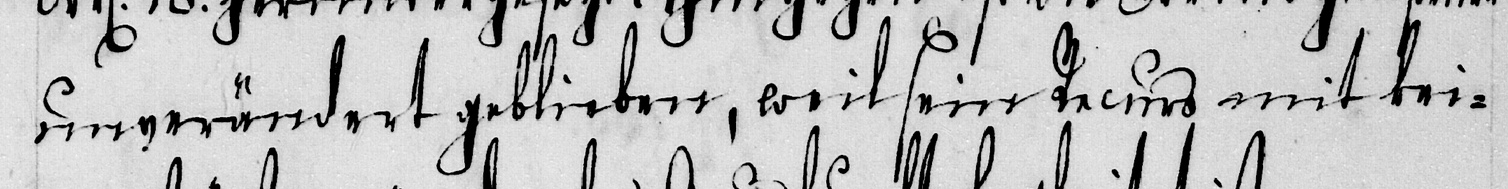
unverändert geblieben, weil sein Recurs mit kei¬
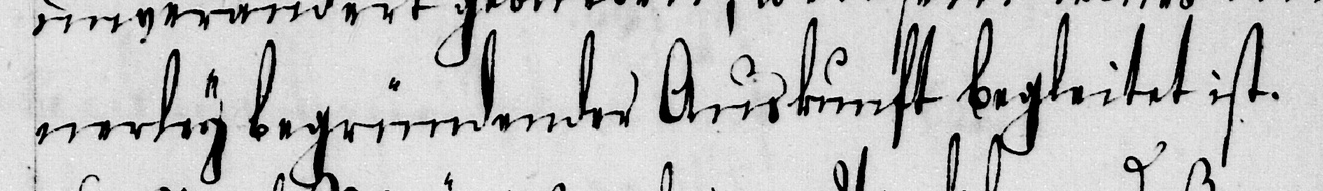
nerley begründender Auskunft begleitet ist.
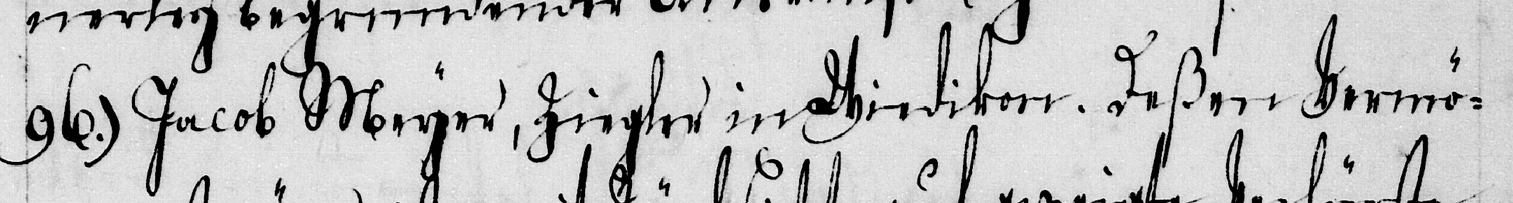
96.) Jacob Meyer, Ziegler in Wiedikon. Deßen Vermö¬
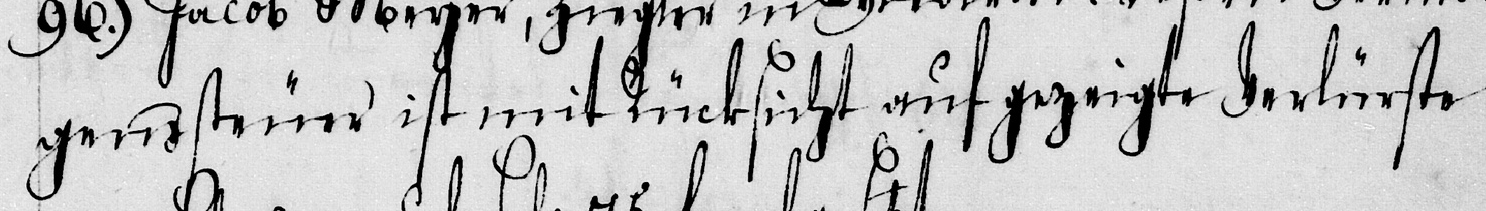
genssteuer ist mit Rücksicht auf gezeigte Verluste
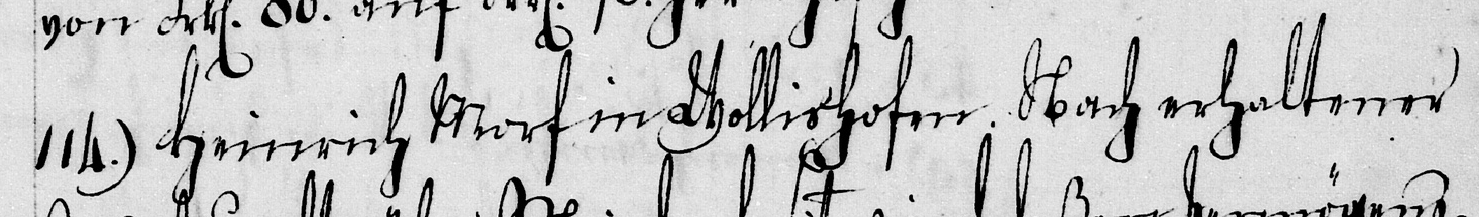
114.) Heinrich Morf in Wollishofen. Nach erhaltener
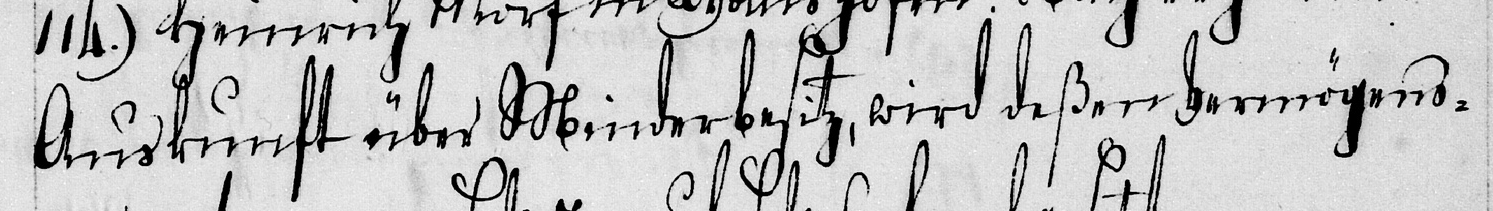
Auskunft über Minderbesitz, wird deßen Vermögens¬
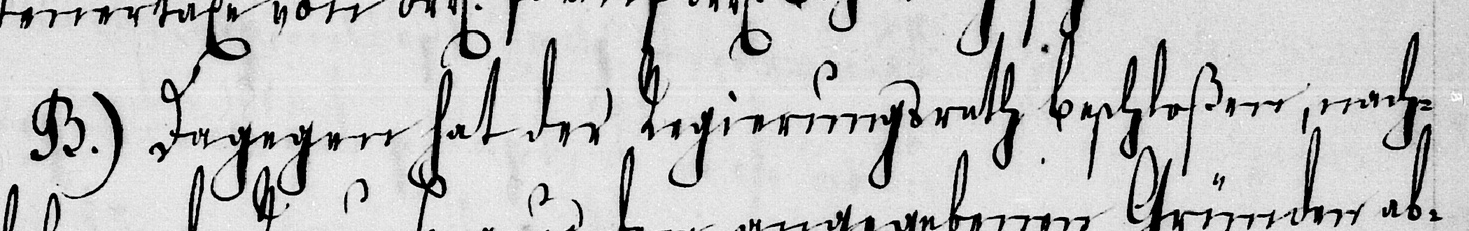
B.) Dagegen hat der Regierungsrath beschloßen, nach¬
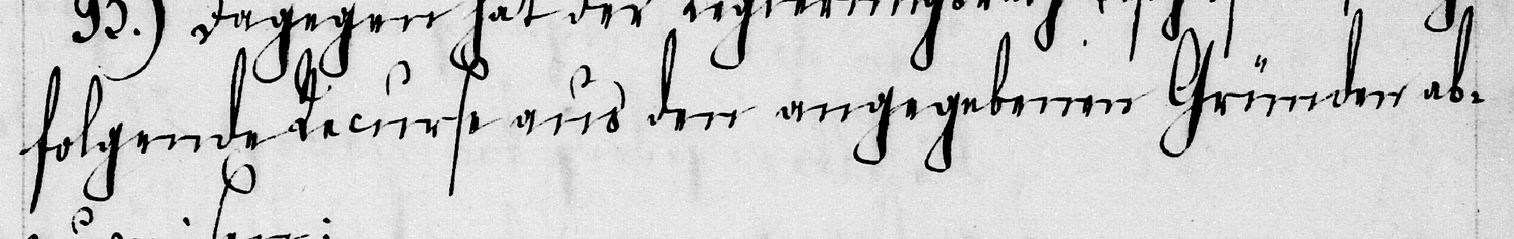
folgende Recurse aus den angegebenen Gründen ab¬
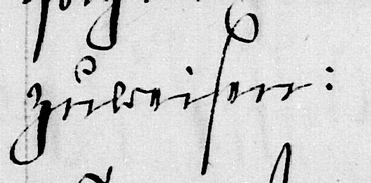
zuweisen:
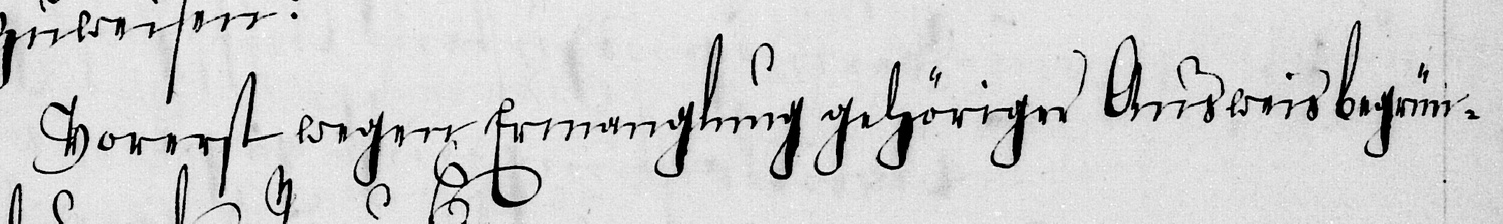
Vorerst wegen Ermanglung gehöriger Ausweisbegrün¬
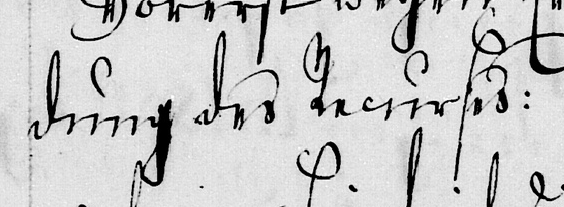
dung des Recurses:
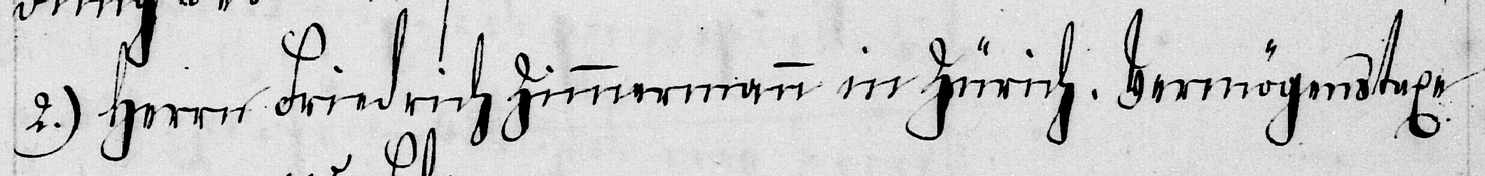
2.) Herrn Friedrich Zimmermann in Zürich. Vermögenstaxe
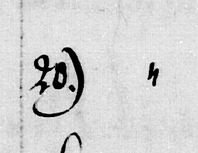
26.)
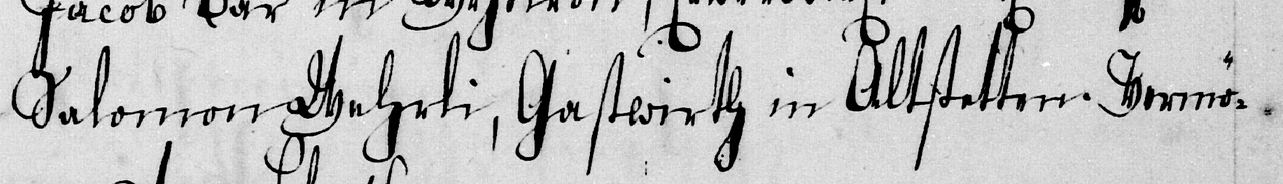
Salomon Wehrli, Gastwirth in Altstetten. Vermö¬
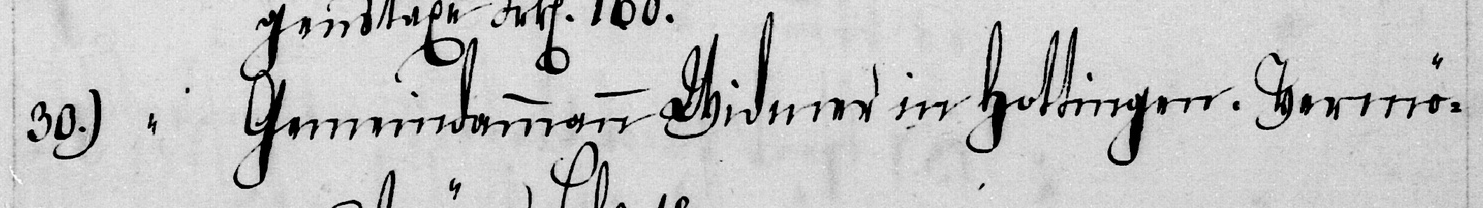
30.) " Gemeindammann Widmer in Hottingen. Vermö¬
